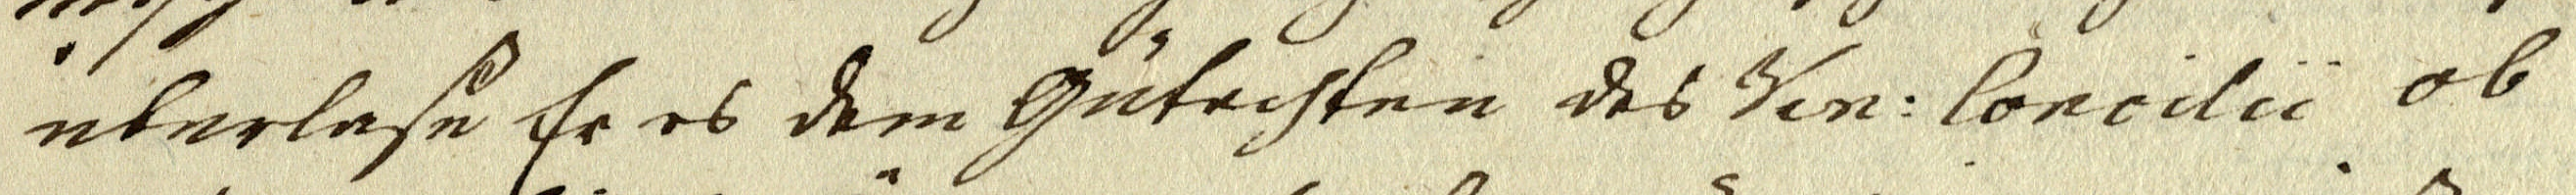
überlaße Er es dem Gutachten des Ven. Concilii ob
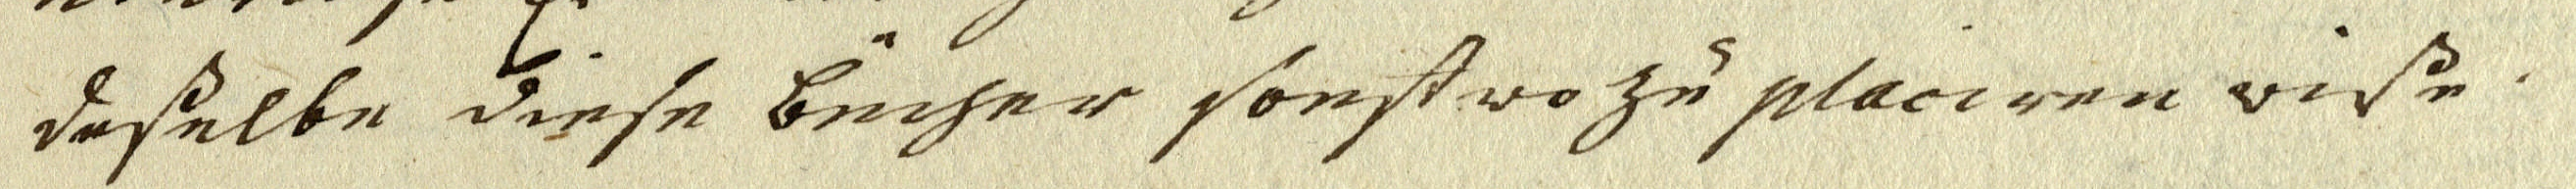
daßelbe diese Bücher sonstwo zu placiren wiße.
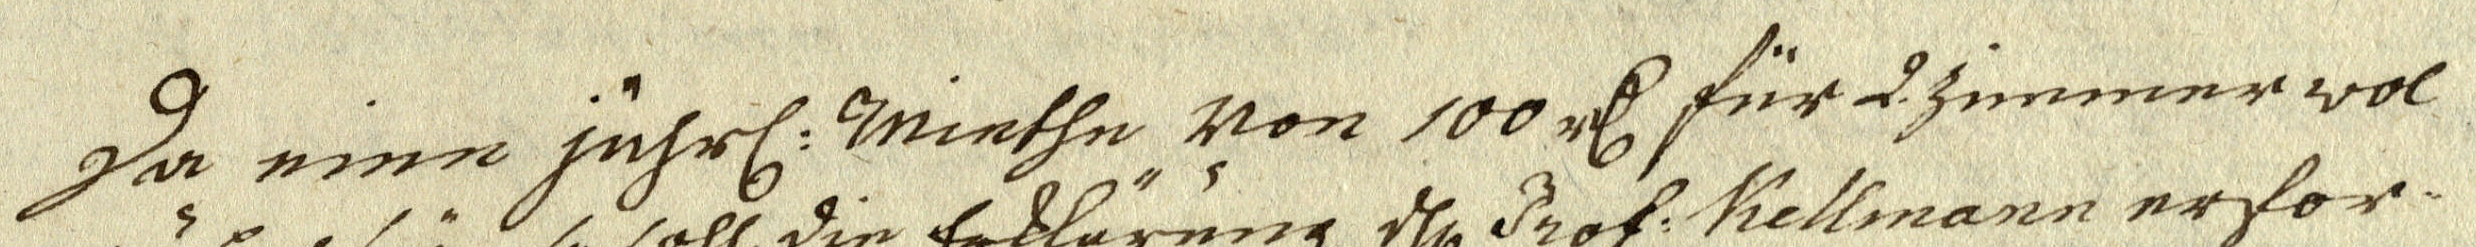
Da eine jährliche Miethe von 100 rl. für 2 Zimmer wol
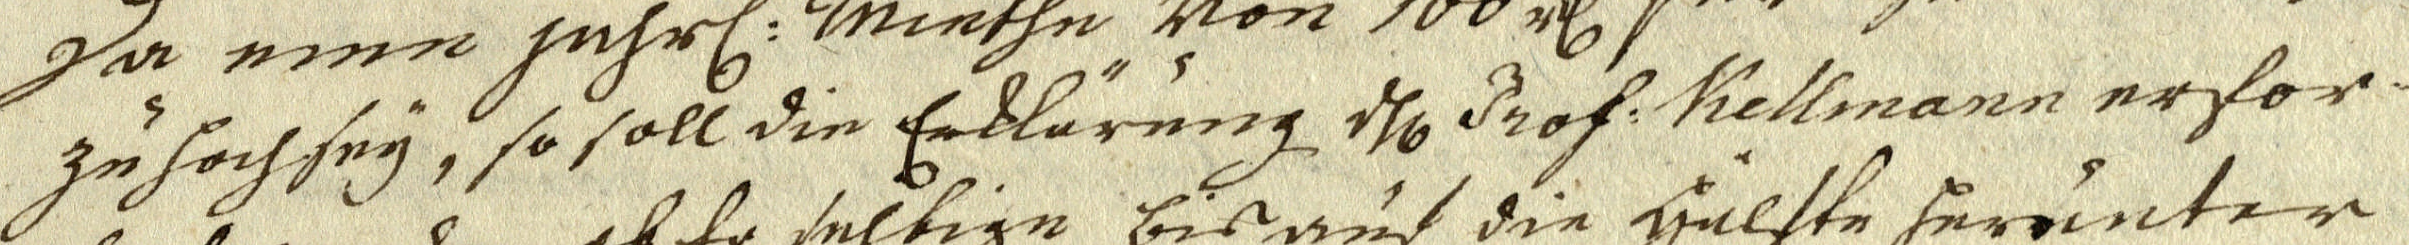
zu hoch seÿ, so soll die Erklärung dh. Prof. Kellmann erfor¬
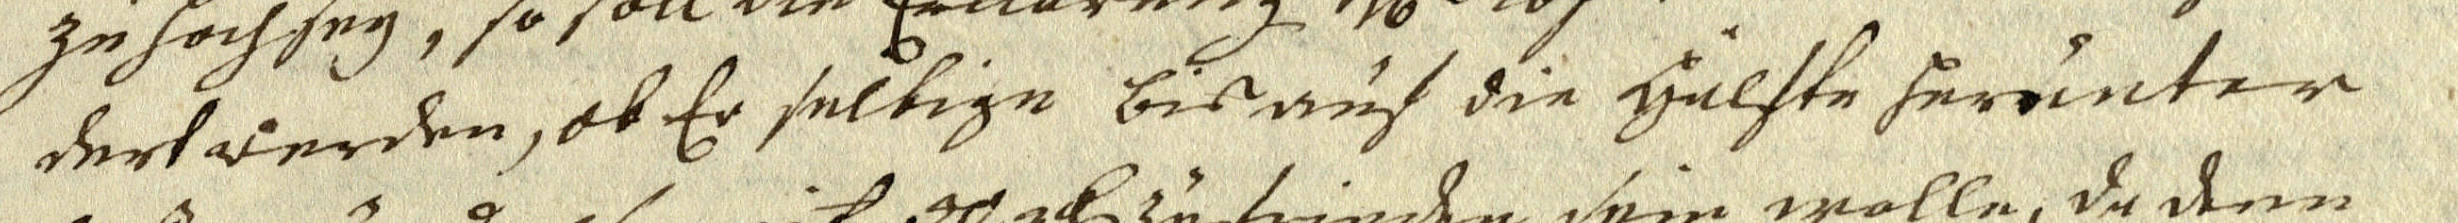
dert werden, ob Er selbige bis auf die Hälfte herunter
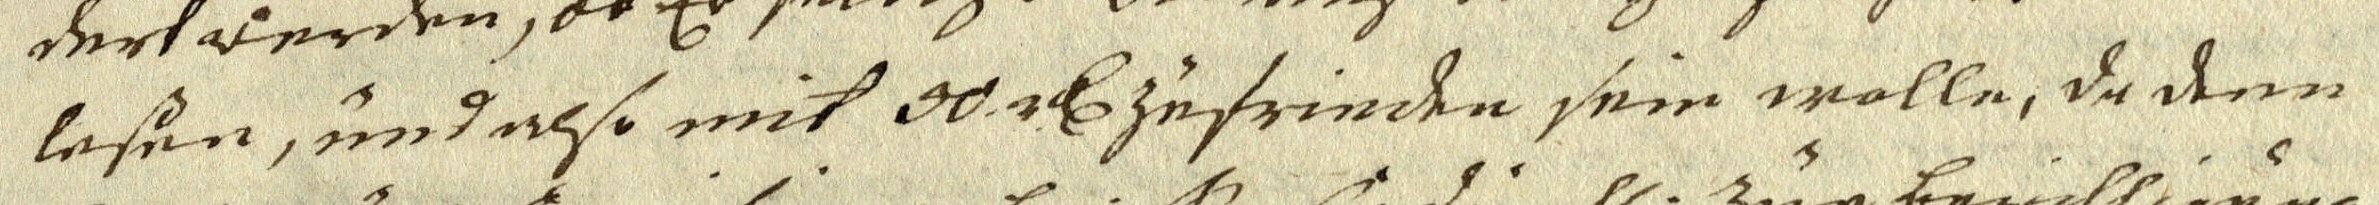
laßen, und also mit 50 rl. zufrieden sein wolle, da denn
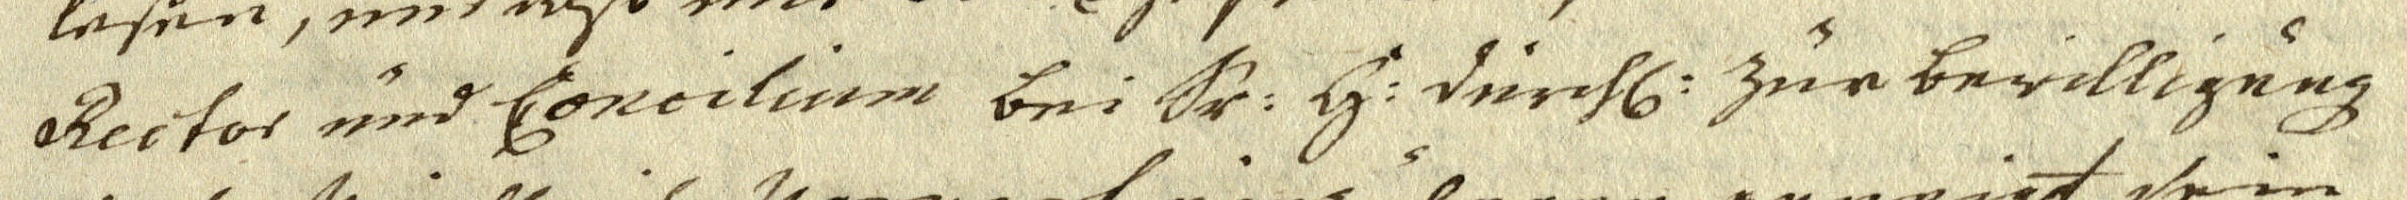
Rector und Concilium bei Sr. H. Durchl. zur Bewilligung
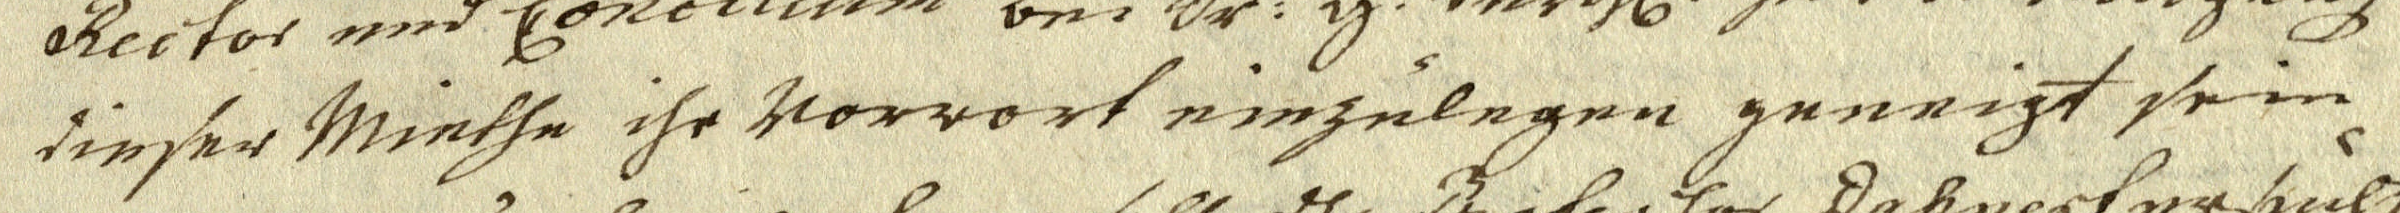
dieser Miethe ihr Vorwort einzulegen geneigt sein
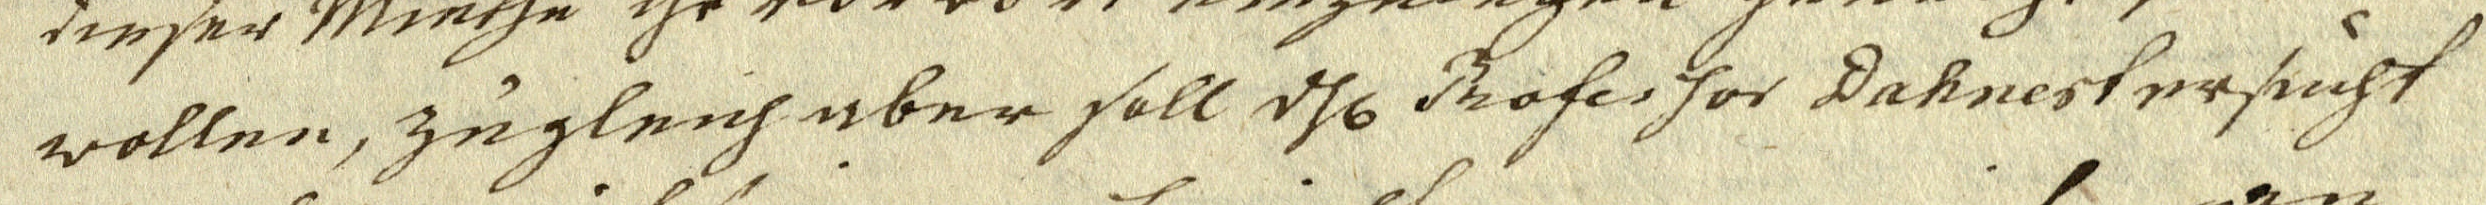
wollen, zu gleich aber soll dh. Professor Dähnert ersucht
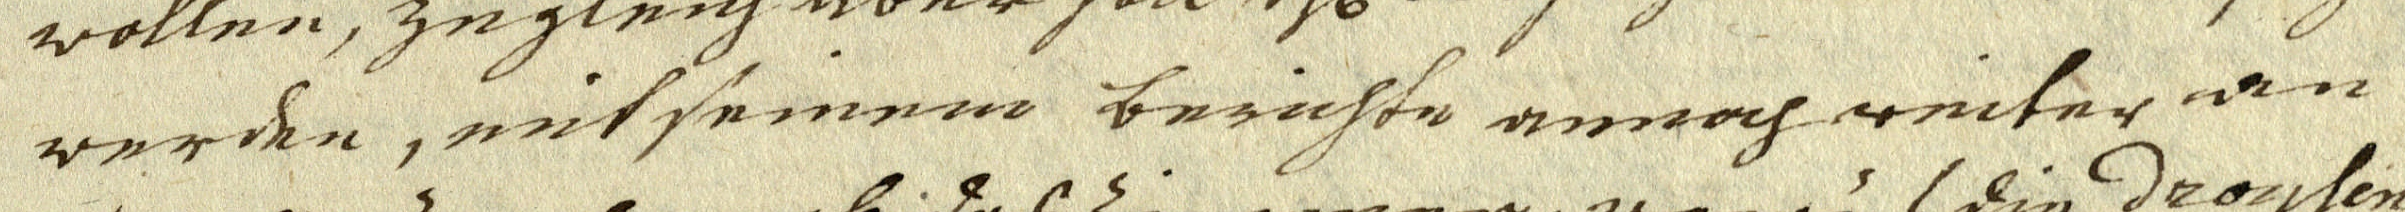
werden, mit seinem Berichte annoch weiter an
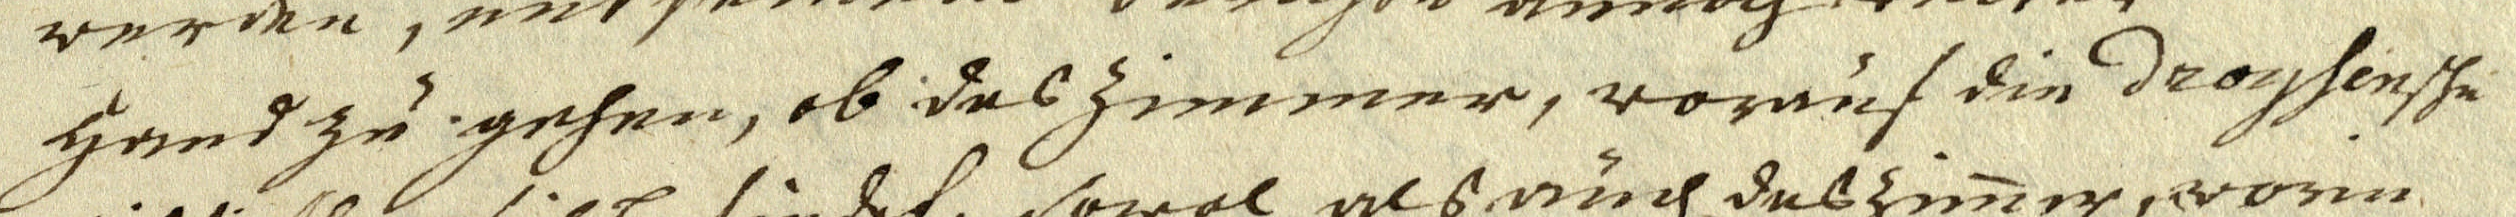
Hand zu gehen, ob das Zimmer, worauf die Droÿsensche
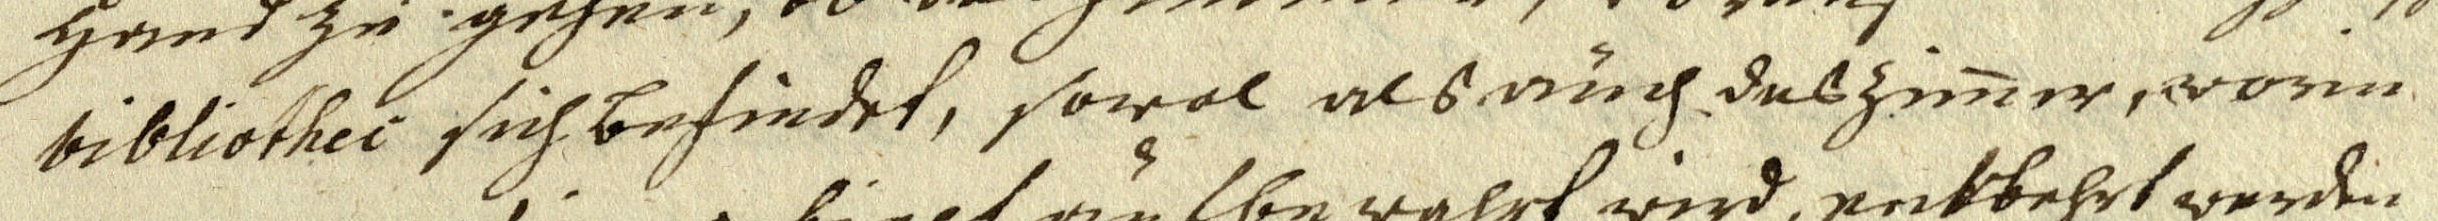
bibliothec sich befindet, sowol als auch das Zimer, worin
